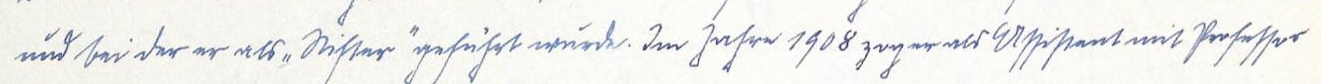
und bei der er als Stifter geführt wurde. Im Jahre 1908 zog er als Assistent mit Professor
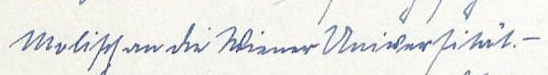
Molitsch an die Wiener Universität.-
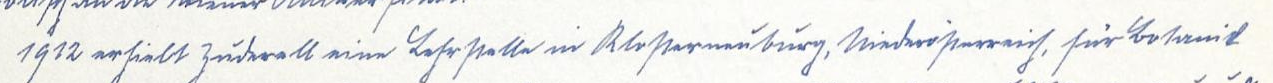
1912 erhielt Zuderell eine Lehrstelle in Klosterneuburg, Niederösterreich, für Botanik
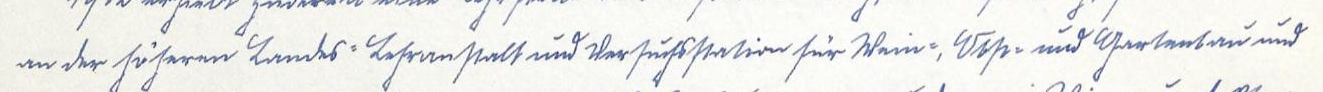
an der höheren Landes-Lehranstalt und Versuchsstation für Wein-, Obst- und Gartenbau und
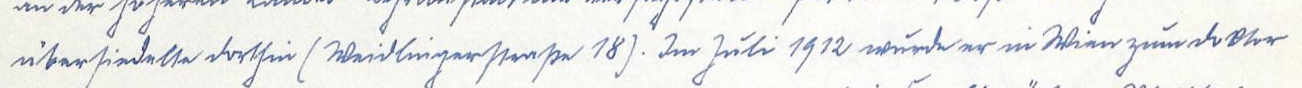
übersiedelte dorthin (Weidlingerstraße 18). Im Juli 1912 wurde er in Wien zum Doktor der
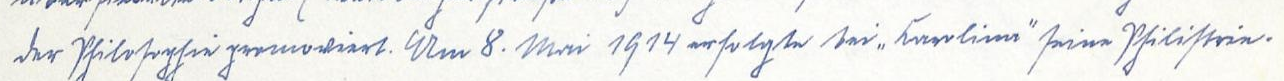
Philosophie promoviert. Am 8. Mai 1914 erfolgte bei „Carolina“ seine Philistrie-
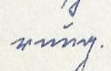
rung.
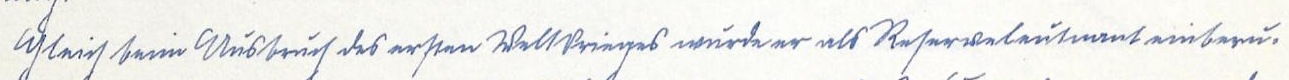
Gleich beim Ausbruch des ersten Weltkrieges wurde er als Reserveleutnant einberu-
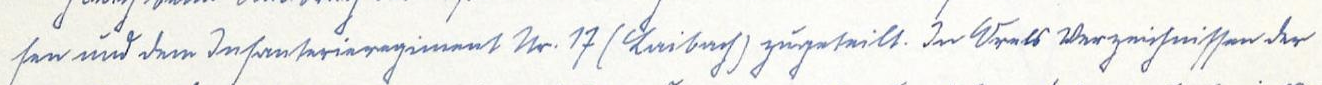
fen und dem Infanterieregiment Nr. 17 (Laibach) zugeteilt. In der Orels Verzeichnissen der
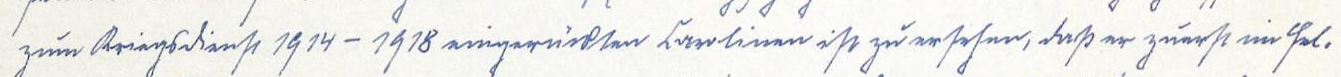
zum Kriegsdienst 1914-1918 eingerückten Carolinen ist zu ersehen, daß er zuerst im Fel-
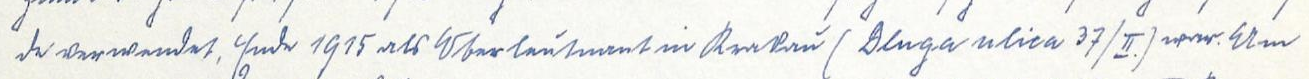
de verwundert, Ende 1915 als Oberleutnant in Krakau (Dluga ulica 37/II.) war. Am
